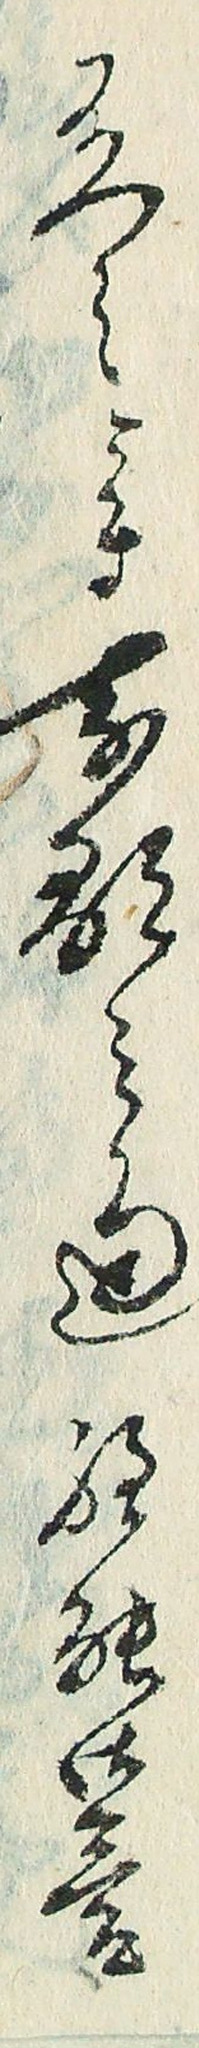有之に付前顕之通程能御答
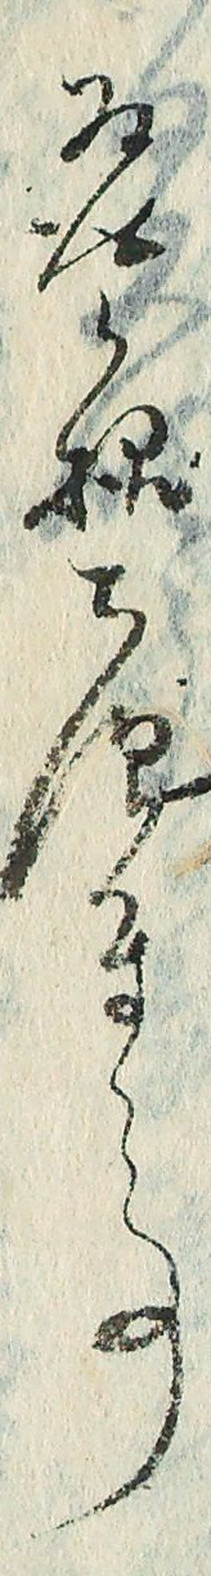為仕候様被仰付候事
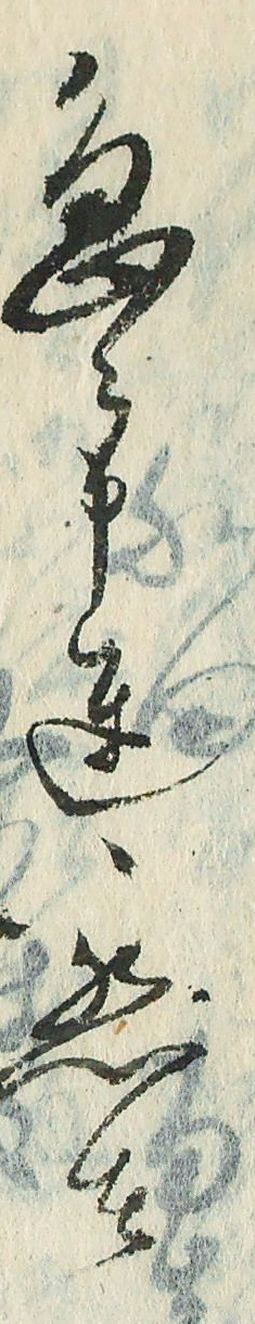急々申達候然は
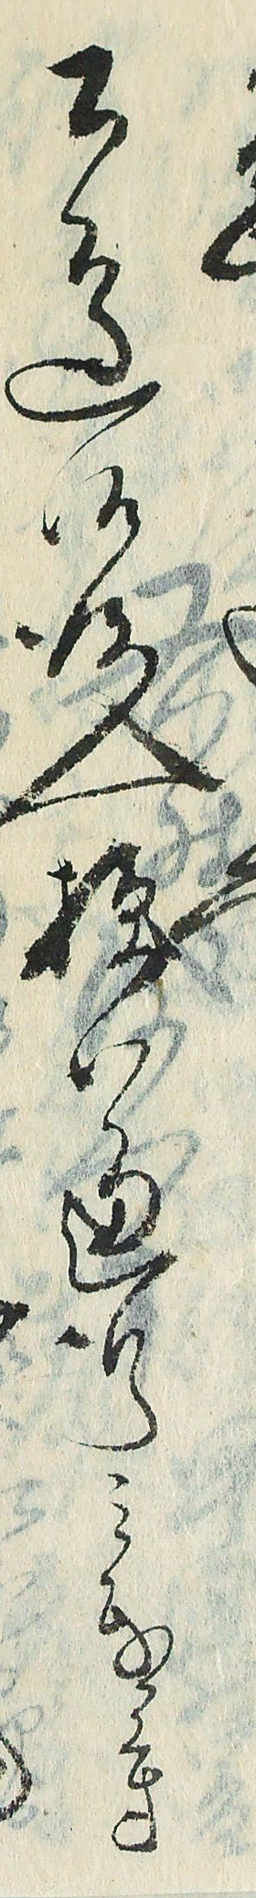公辺御役人様御通行之義に付
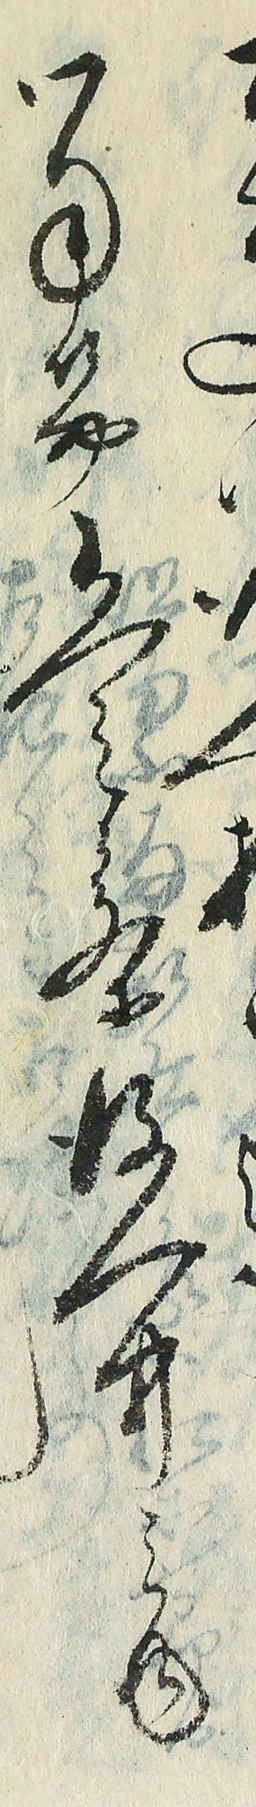御用筋有之候条役人中之内
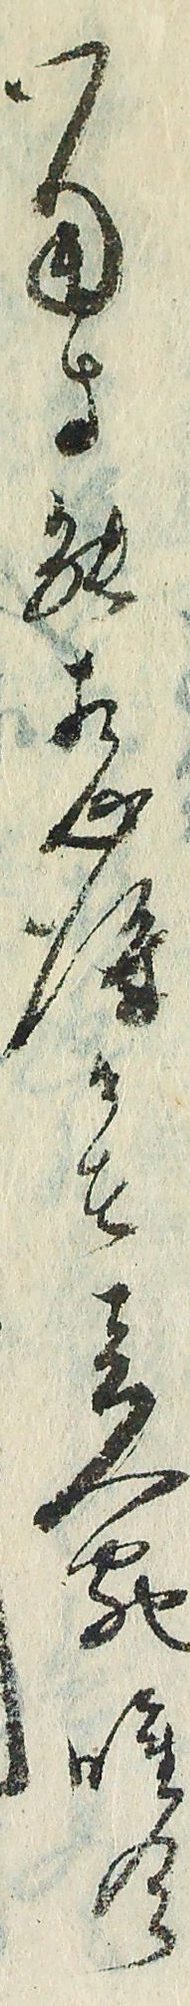御用方能相心得候者壱人宛唯今
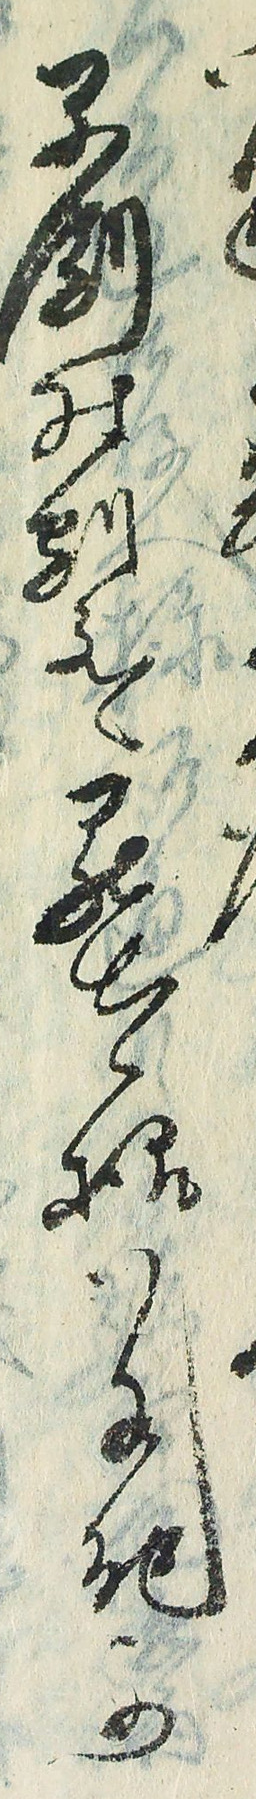早淵村割元へ罷出候様御手配可
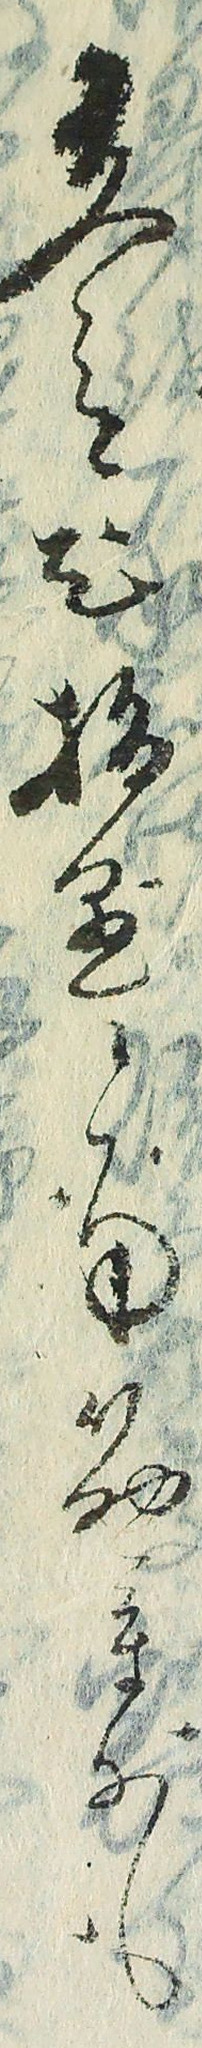有之候尤指懸候御用筋に付少も
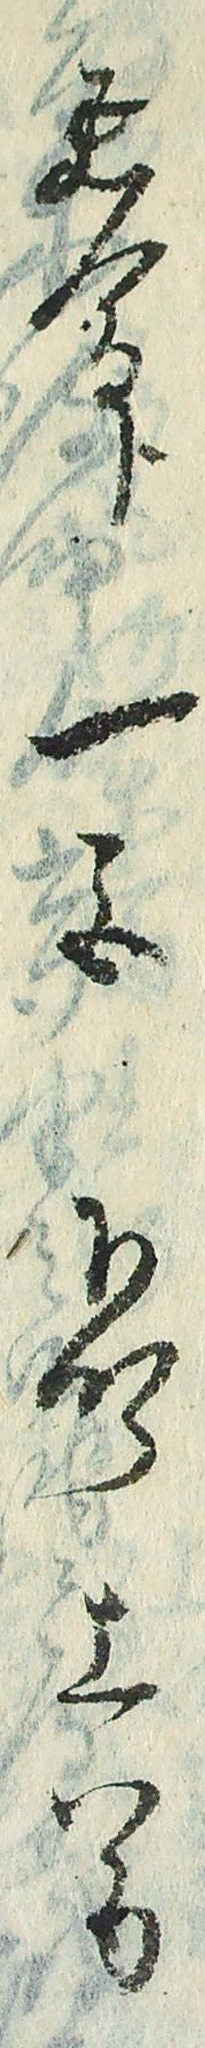延命一宮下町上八万
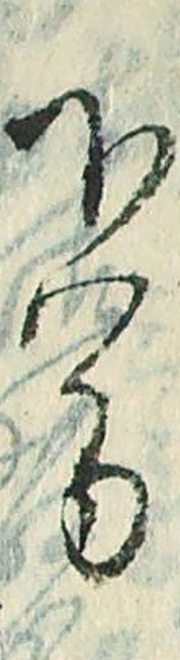下八万
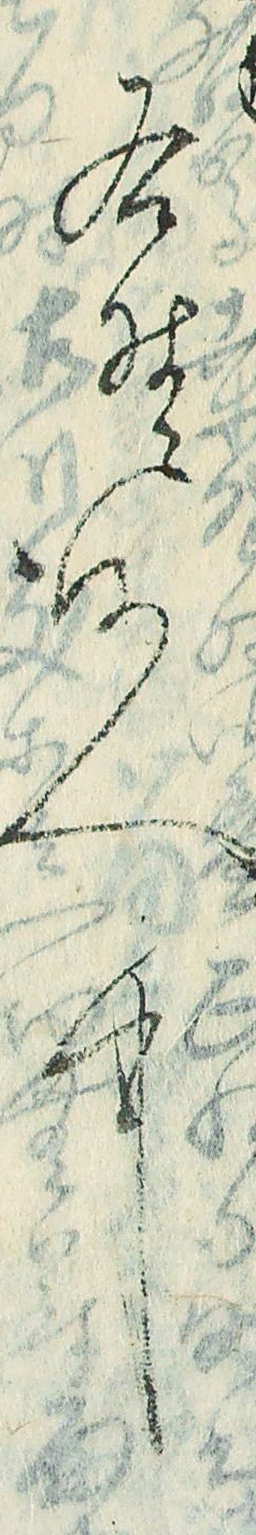右村々役人中

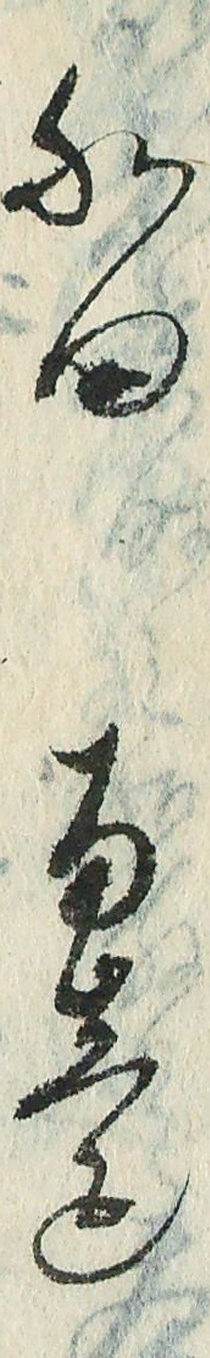和田南先迄
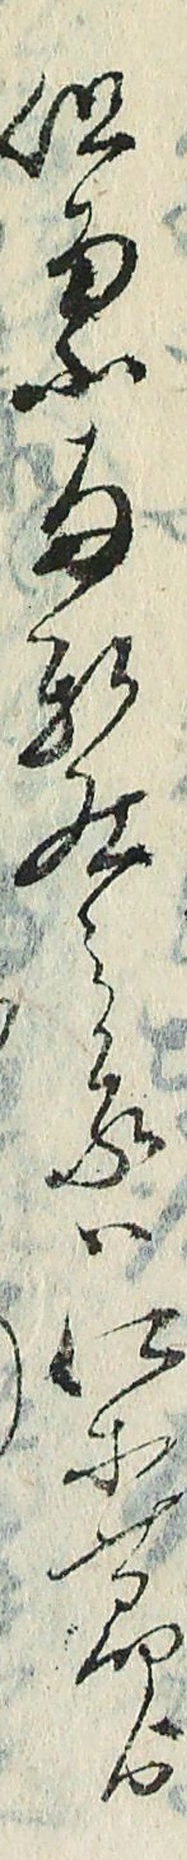但南北両新居之義は仁木節ゟ
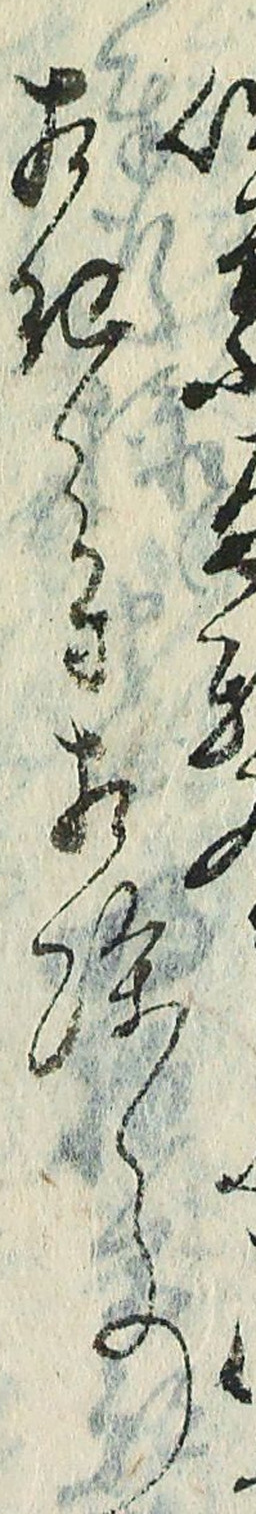相配候に付相除候事
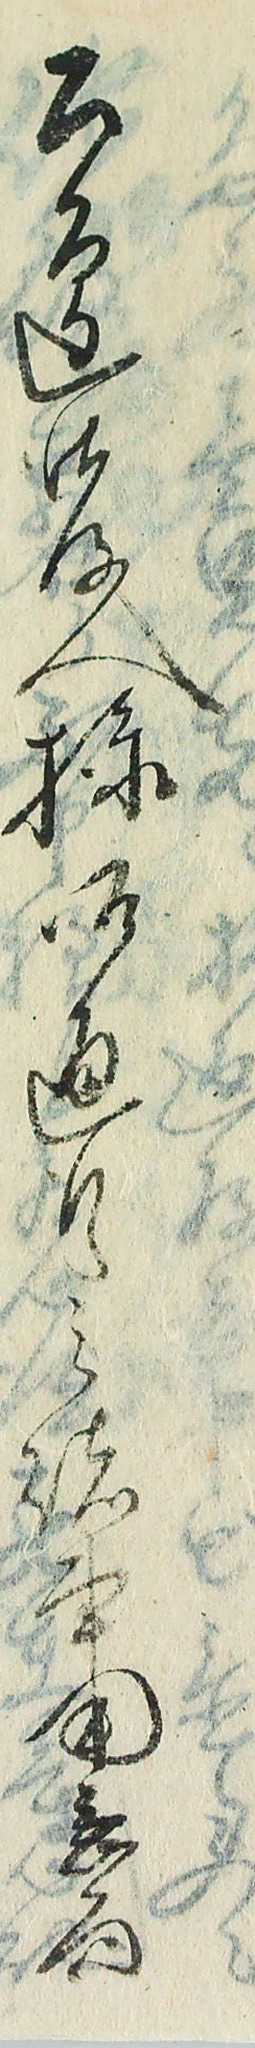公辺御役人様御通行之諸事用意向
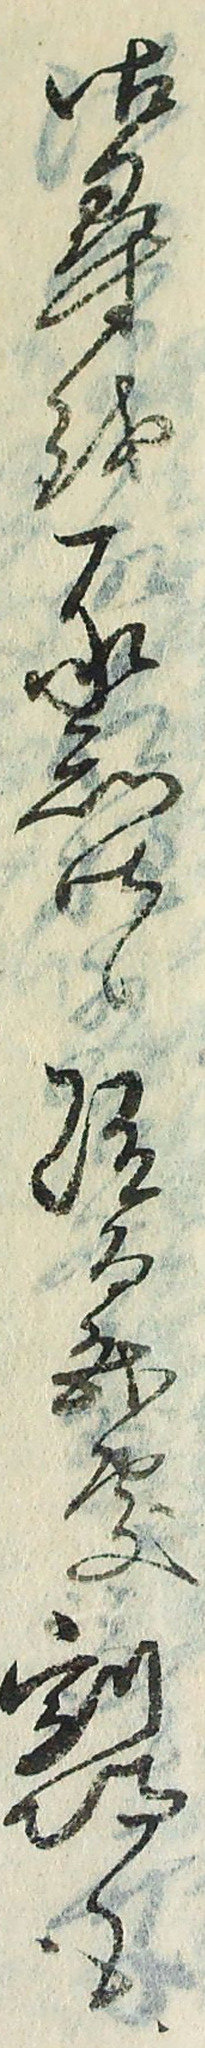御尋越承知仕候随て当処割場も
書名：公辺御役人為御廻浦御立越諸御用一巻
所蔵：鳴門教育大学 Naruto University of Education
